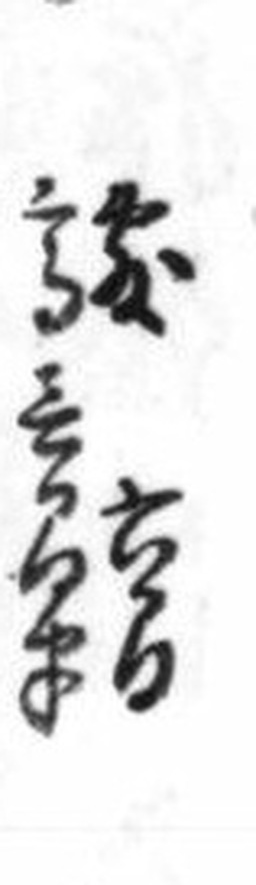高壱間半
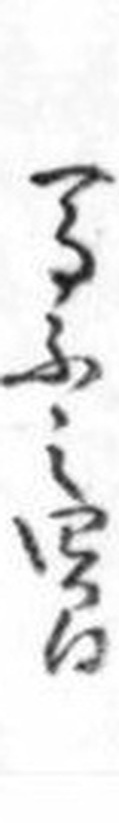馬ふみ壱間
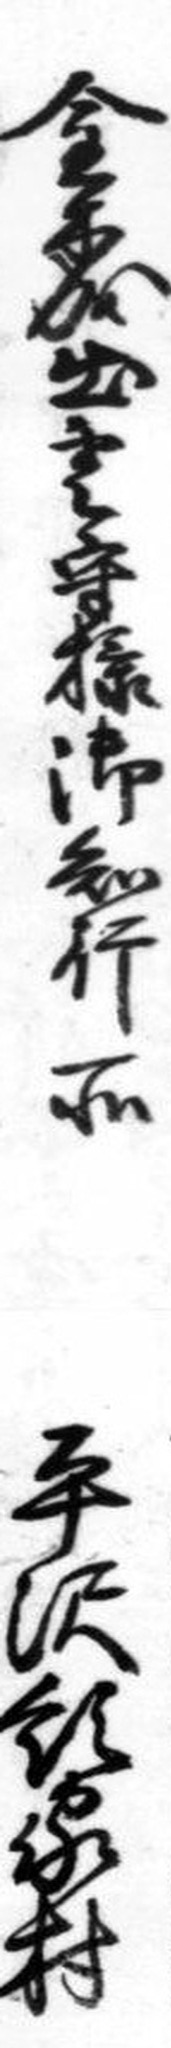金森出雲守様御知行所平沢領家村
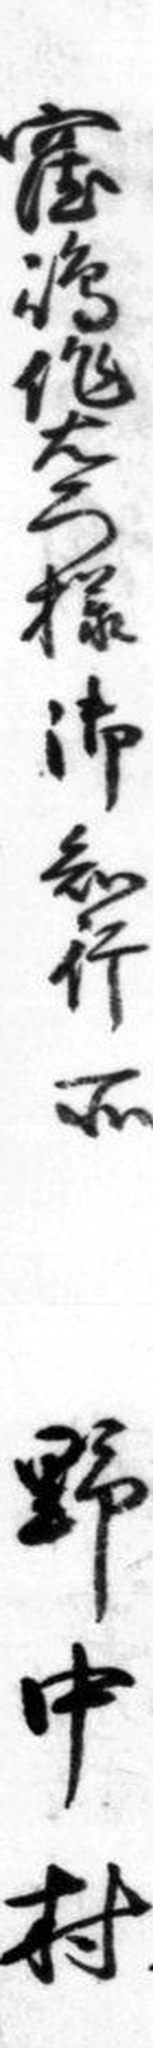窪島作右衛門様御知行所野中村

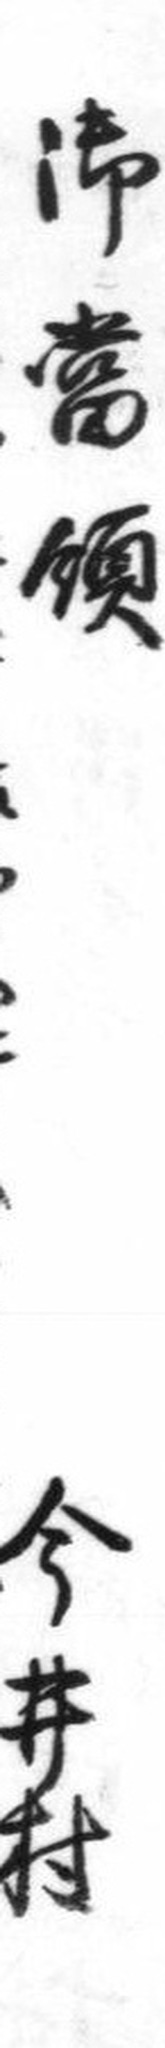御當領今井村
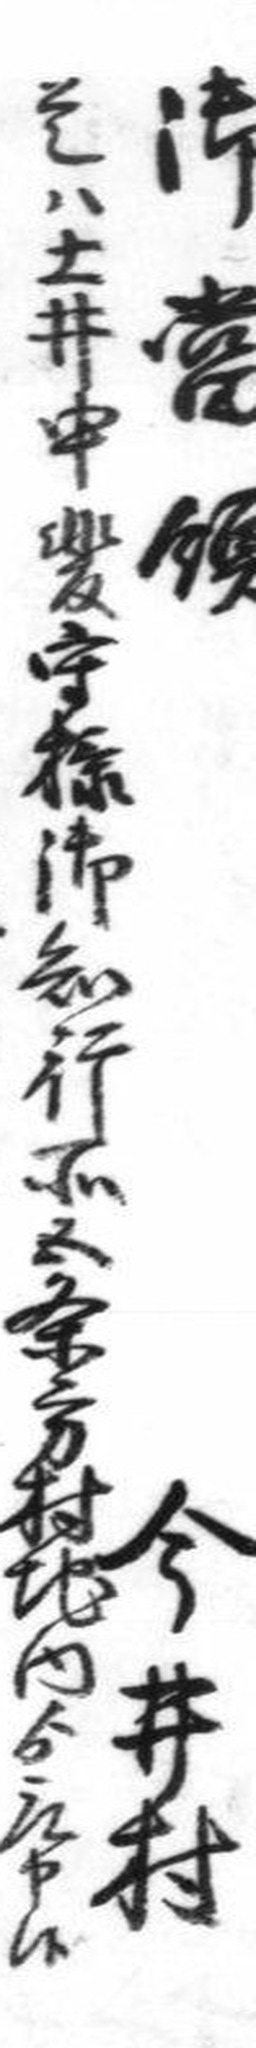是ハ土井甲斐守様御知行所五条方村地内ゟ取申候
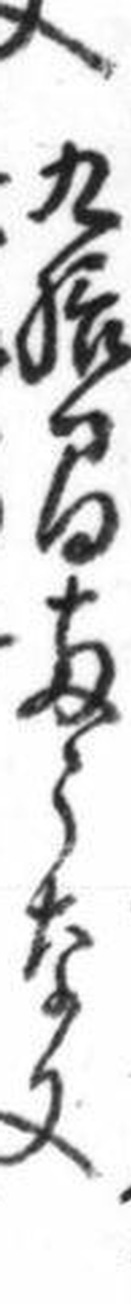六拾間斤うな又
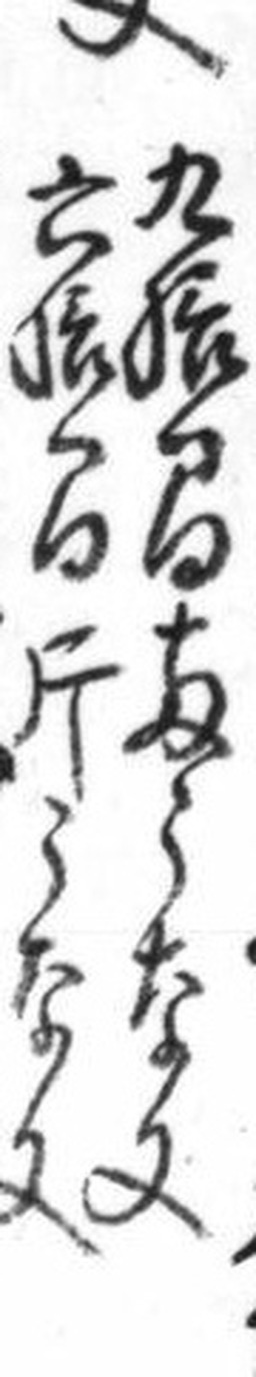六拾間斤うな又
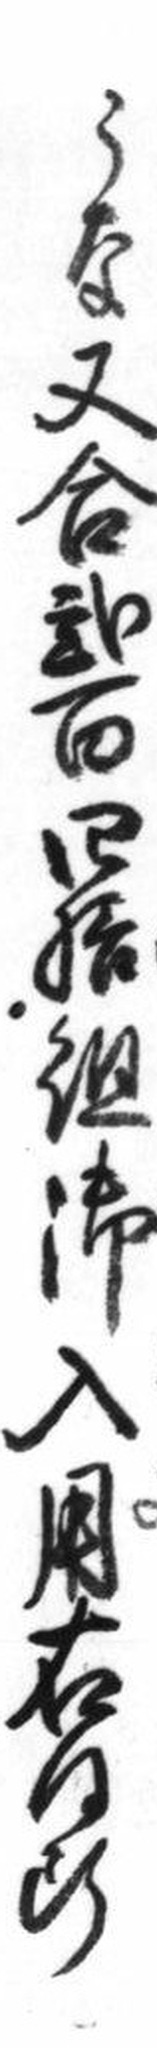うな又合弐百四拾組御入用右同断
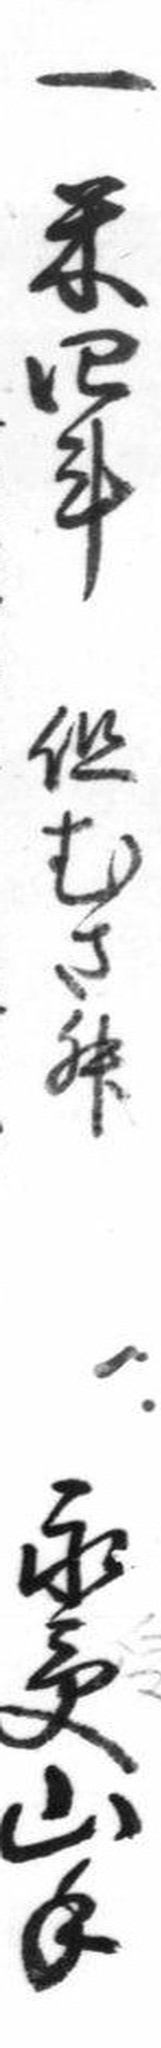一米四斗但むさ舛永受山手
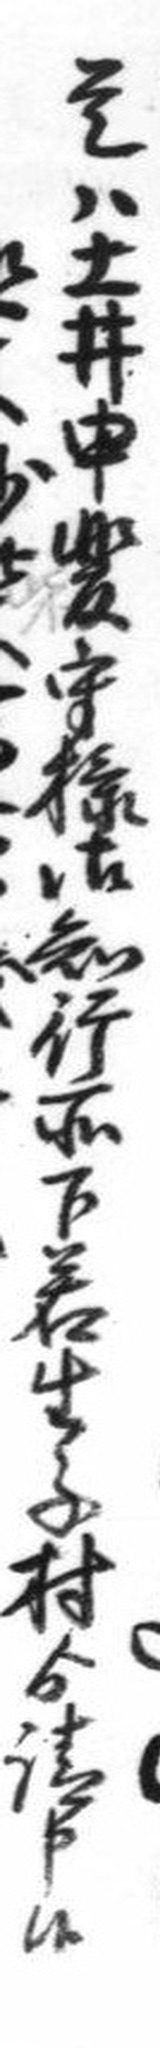是ハ土井甲斐守様御知行所下若生子村ゟ請申候
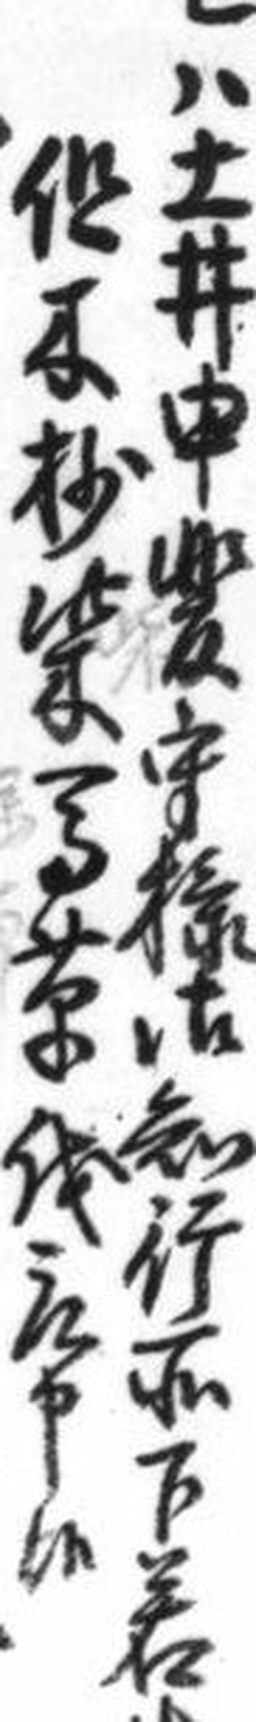但木杪柴馬草伐取申候
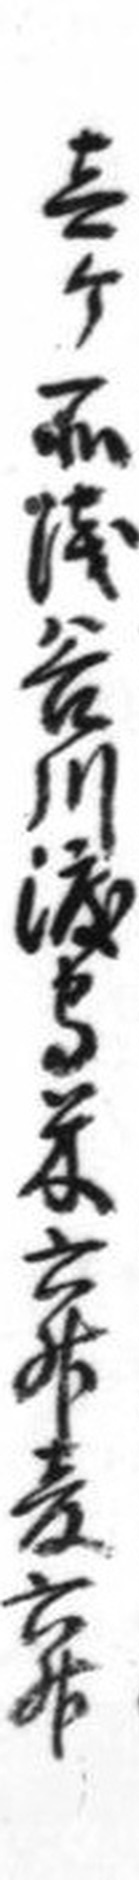壱ケ所浅谷川渡守米六升麦六升
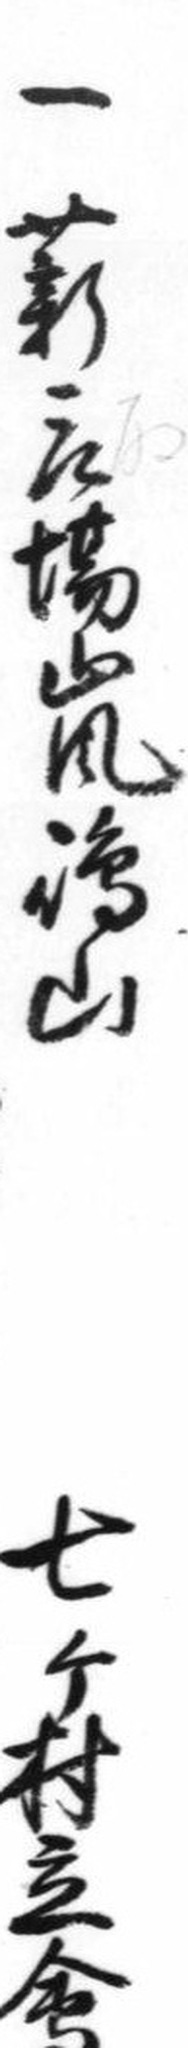一薪取場嵐嶋山七ケ村立會
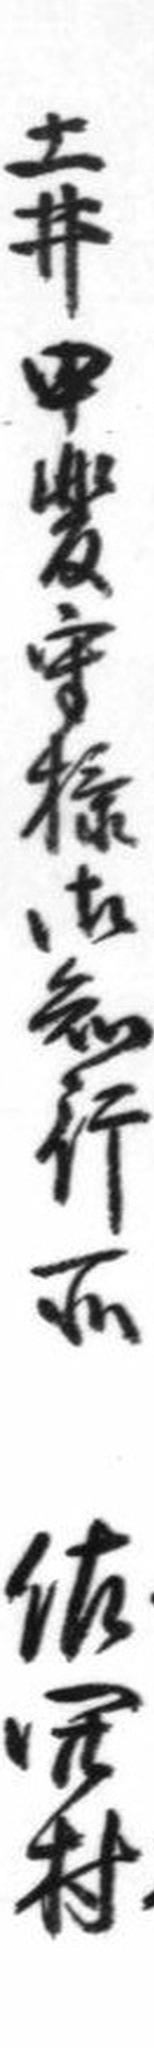土井甲斐守様御知行所佐開村
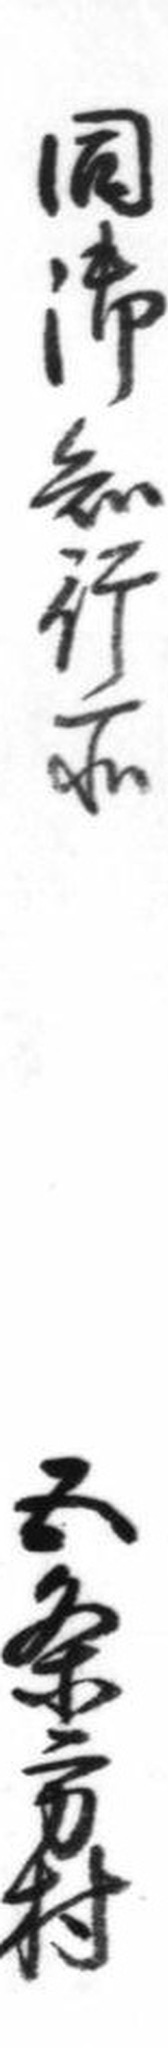同御知行所五条方村
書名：越前国大野郡今井村明細帳
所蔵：福井県文書館 Fukui Prefectural Archives
